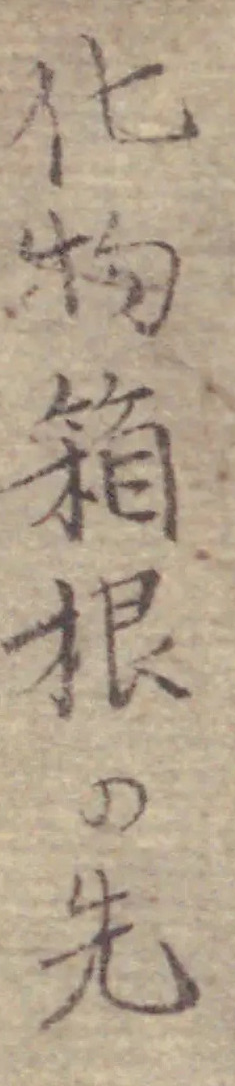化物箱根の先全
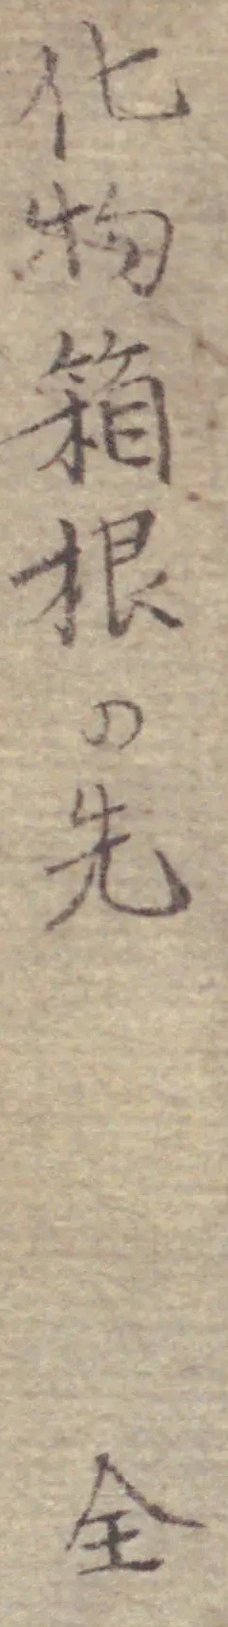化物箱根の先全

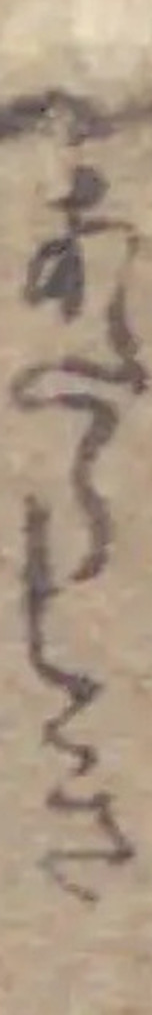あたらしき
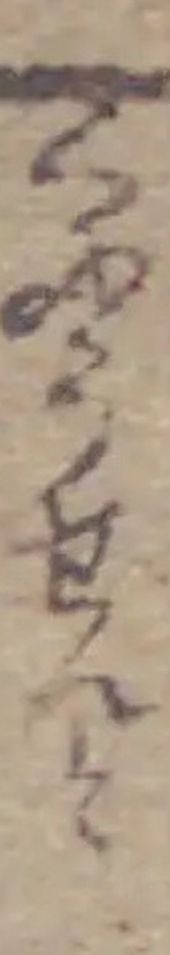くふうせんと
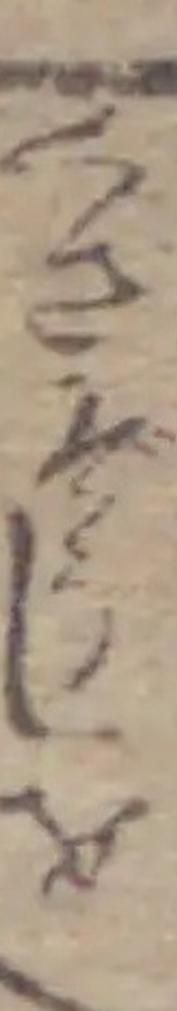くさぞうしを
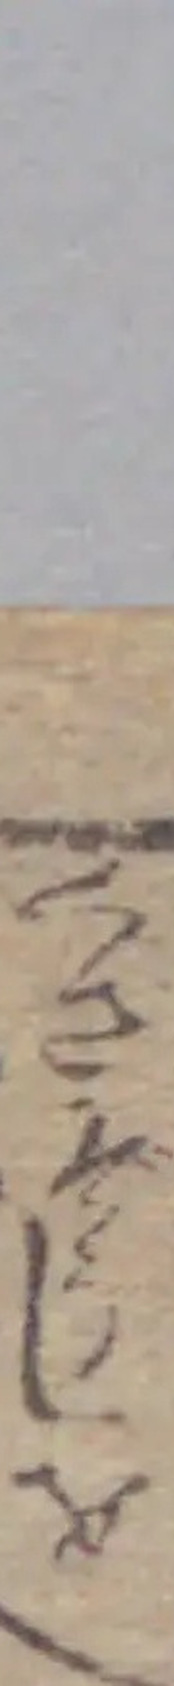くさぞうしを
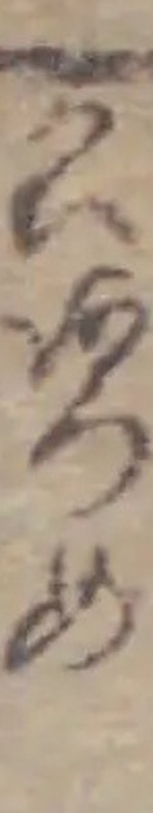かいあつめ
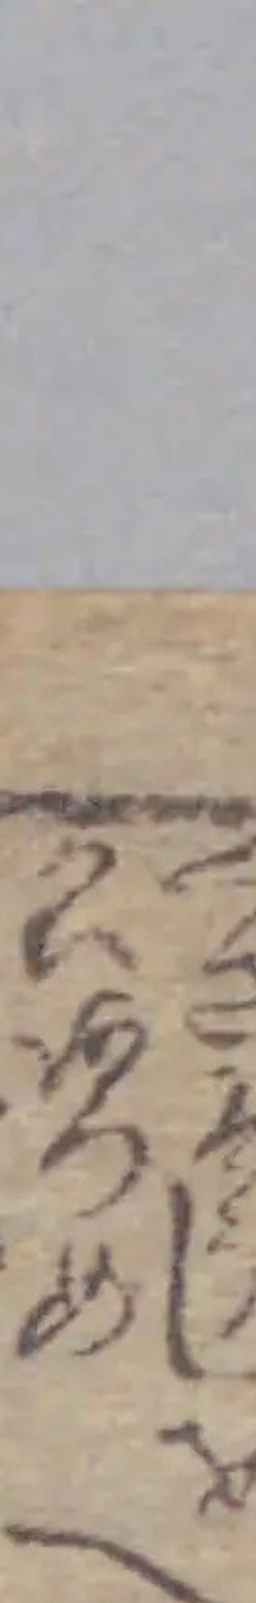かいあつめ
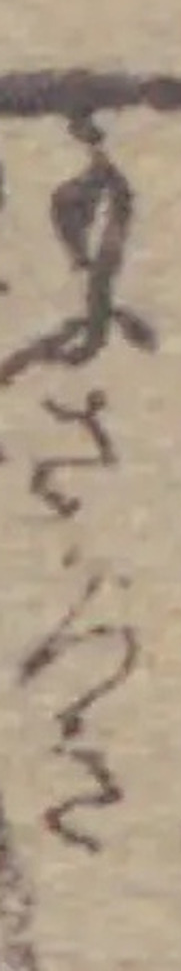もふさかつき
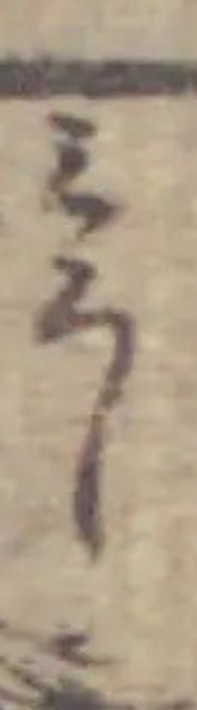みこし
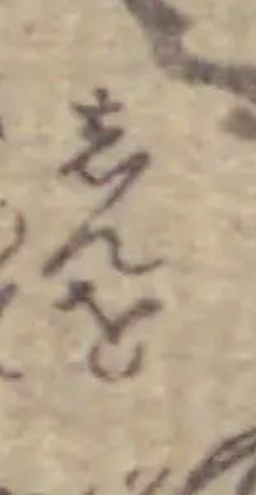しんを
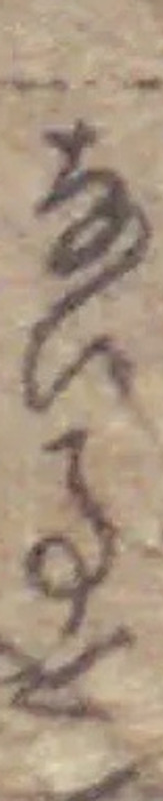ない事を
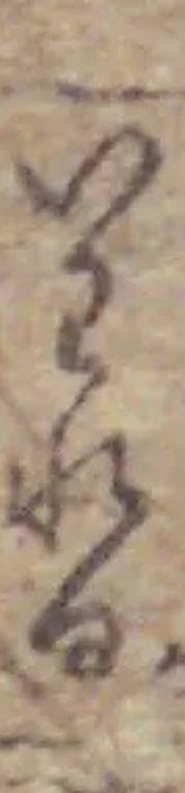いわれる

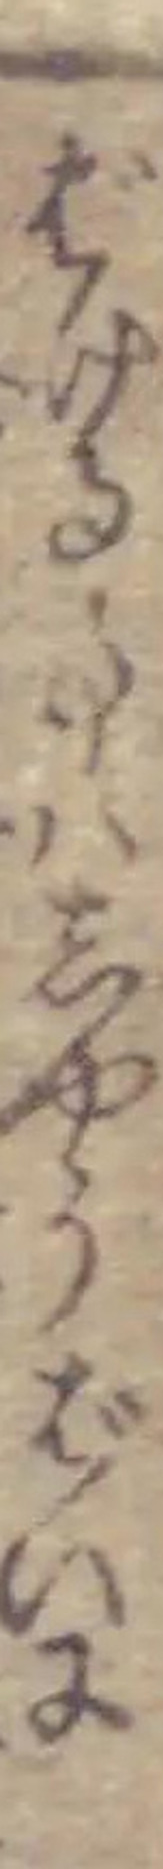ばける事はしやうばいに
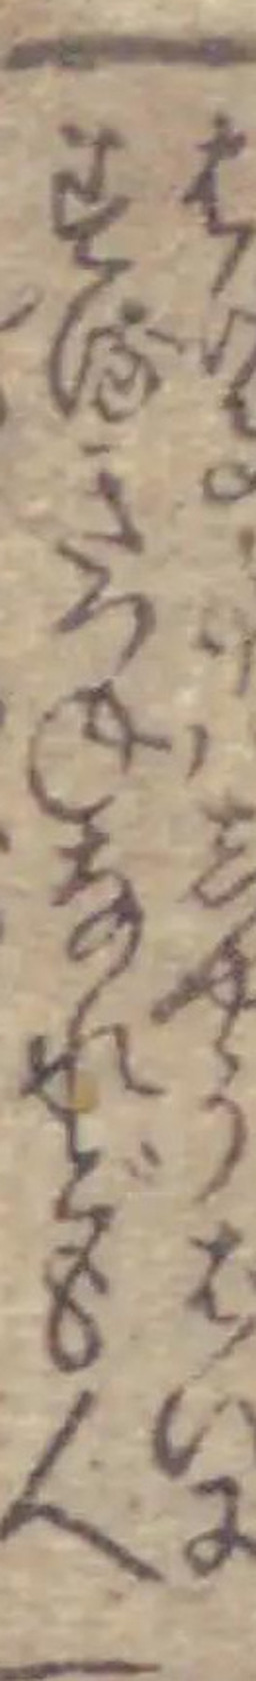するきつねなれども人
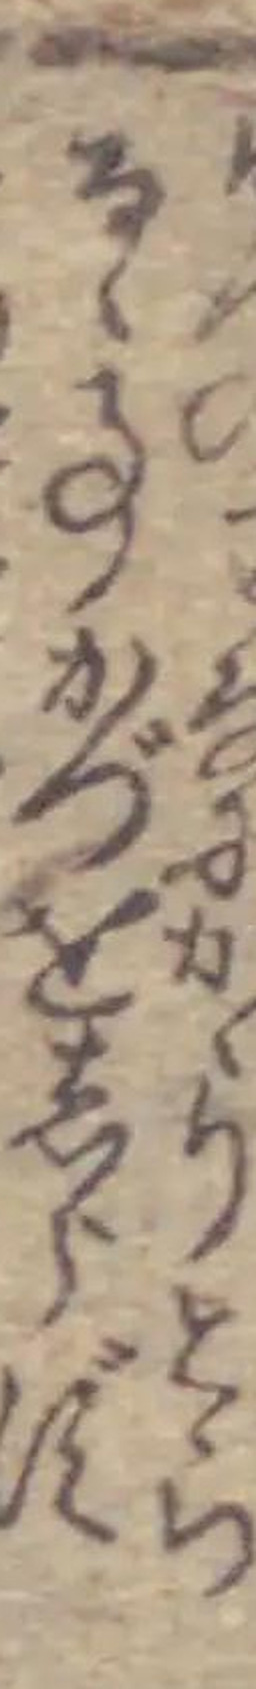るゝ事かづをしらず
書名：化物箱根先 2巻
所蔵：国立国会図書館 National Diet Library, JAPAN
